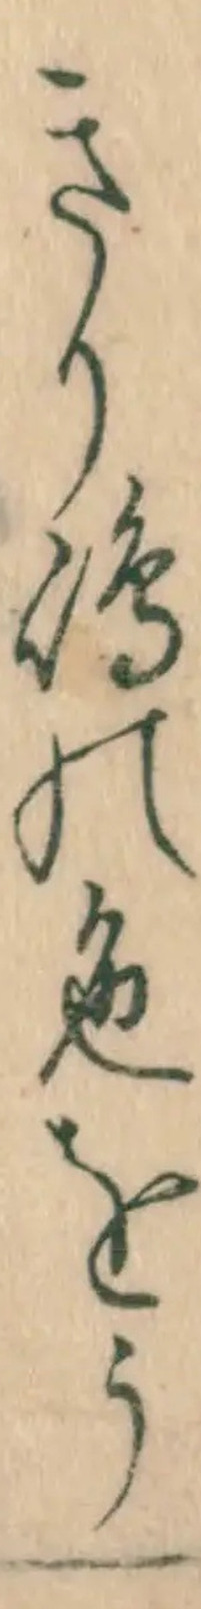きり嶋の色をう
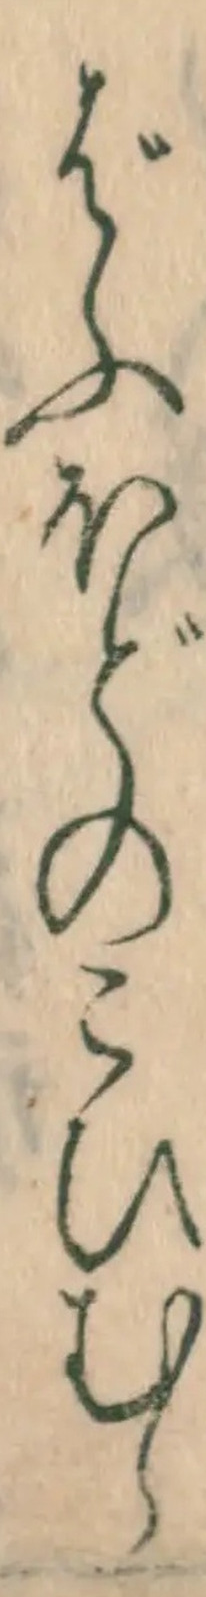ばふほどのこひむら
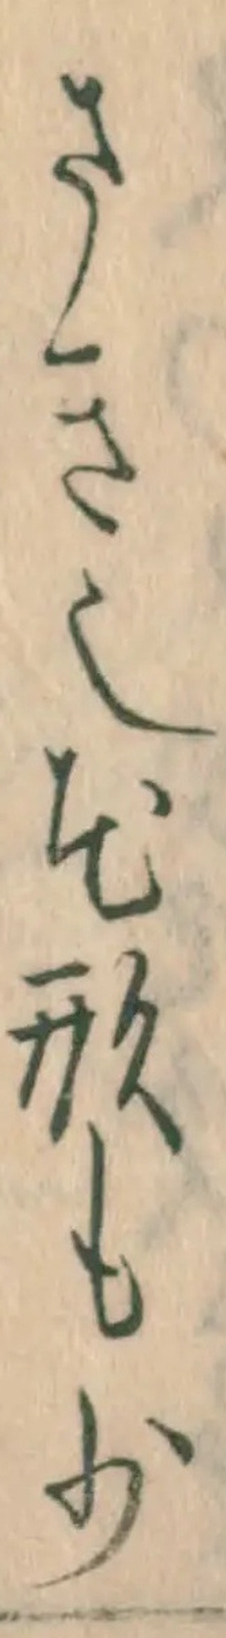さき也花形も少
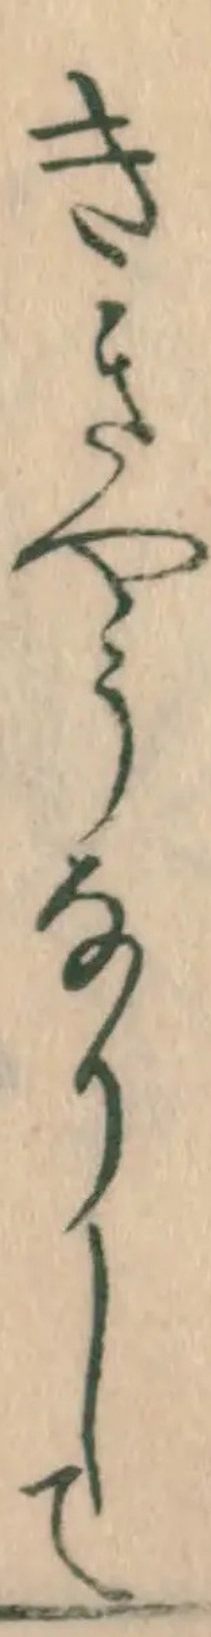ききやうなりして
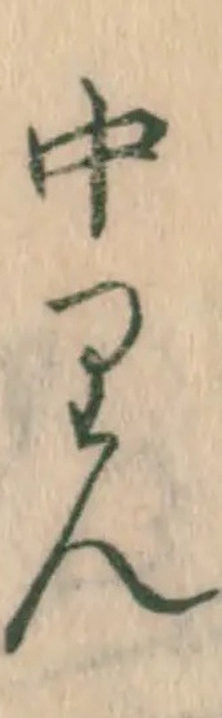中りん
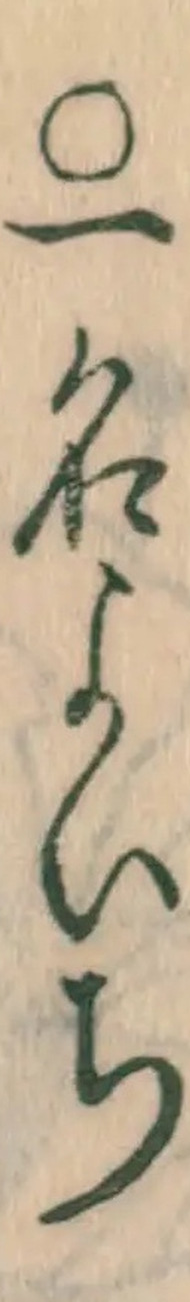○一名よいち
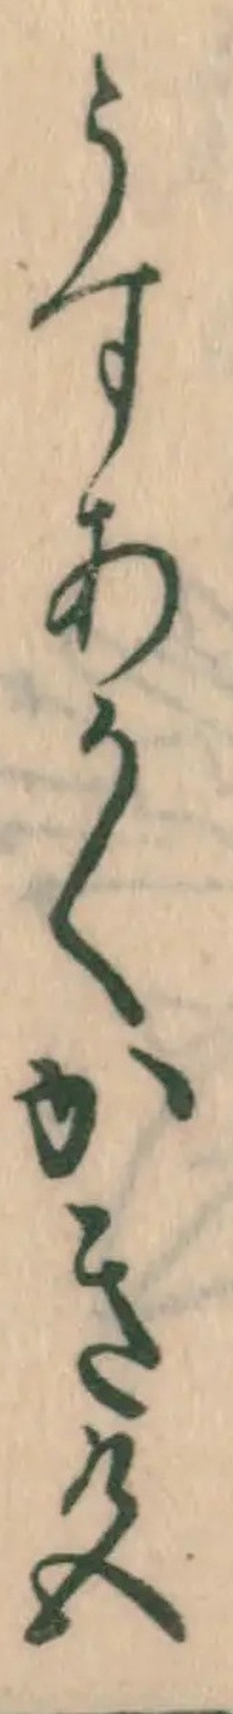うすあかくかき色
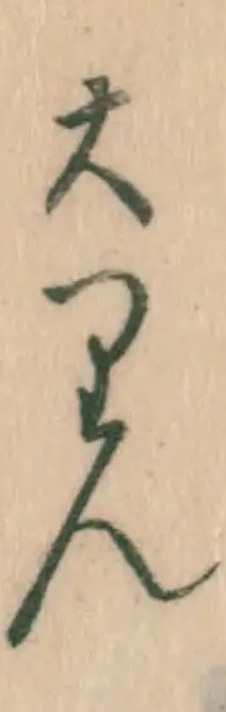大りん
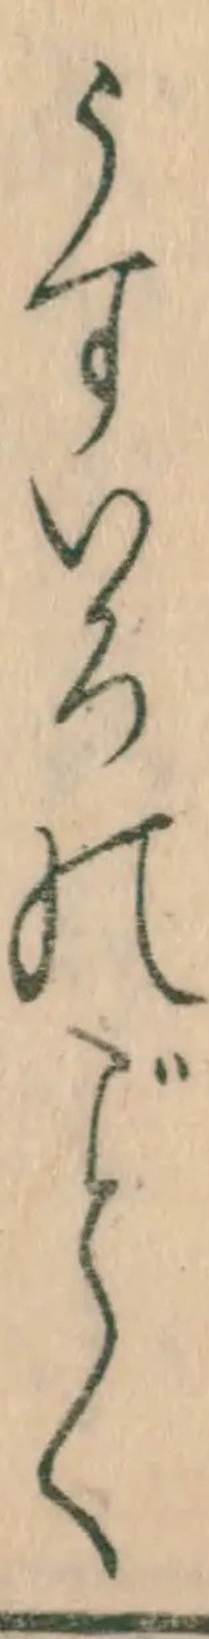うすいろのごとく
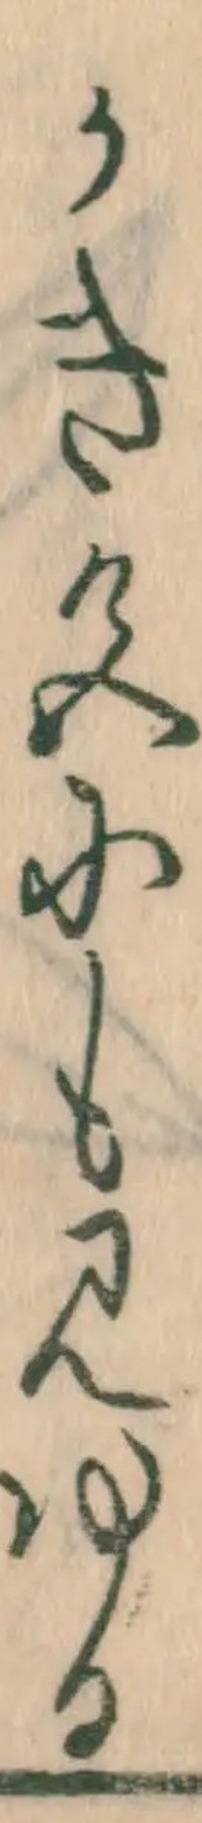かき色にも見ゆる
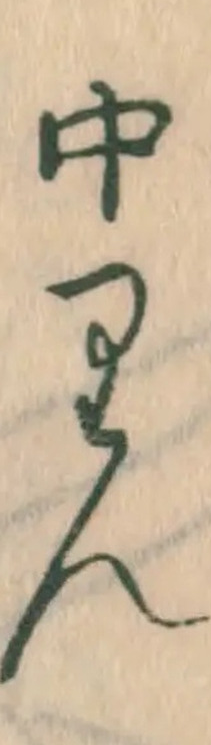中りん
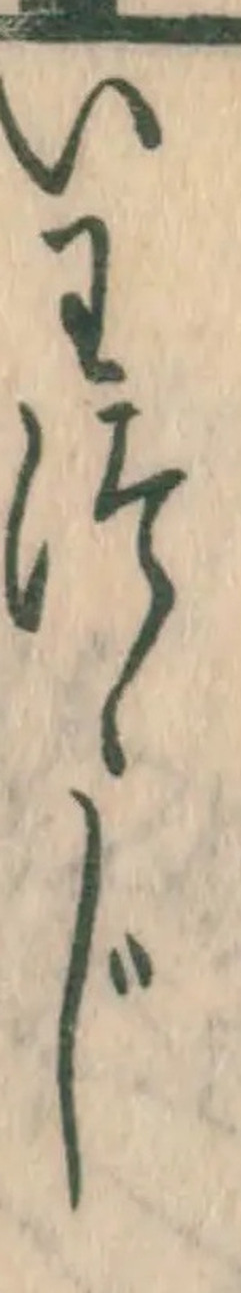いわつゝじ
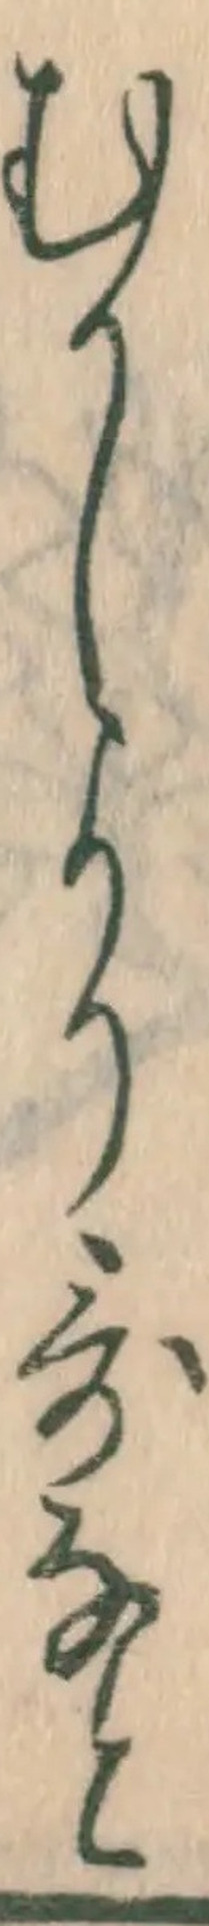むかしより歌なと
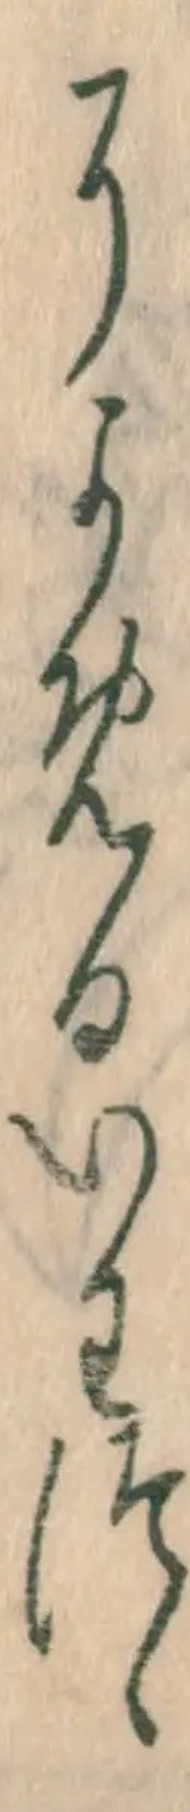によめるいわつ
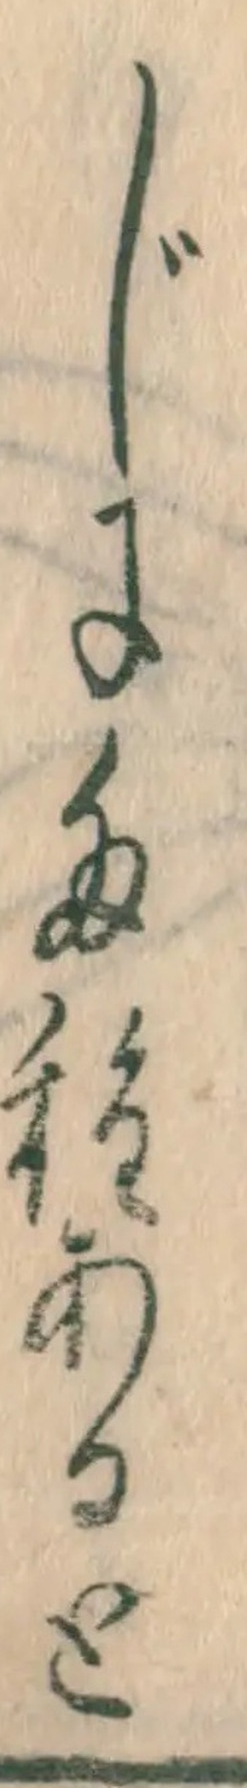じにた種あると
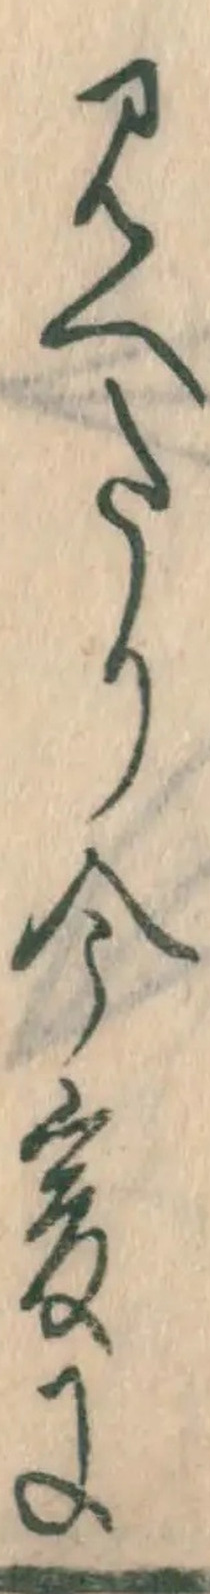見へたり今爰に
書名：錦繍枕 5巻. [2]
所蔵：国立国会図書館 National Diet Library, JAPAN
